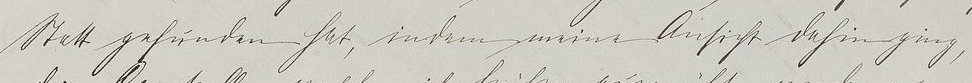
Statt gefunden hat, indem meine Ansicht dahin ging,
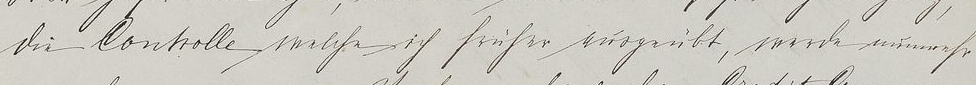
die Controlle welche ich früher ausgeübt, werde nunmehr
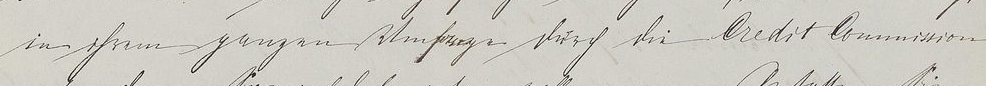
in ihrem ganzen Umfange durch die Credit Commission
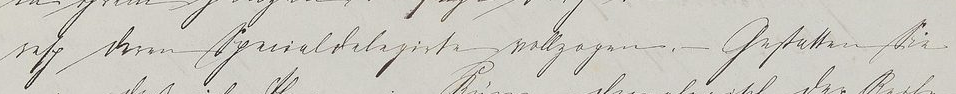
resp deren Specialdelegirte vollzogen. – Gestatten Sie
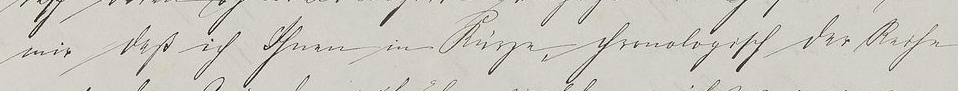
mir daß ich Ihnen in Kürze, chronologisch der Reihe
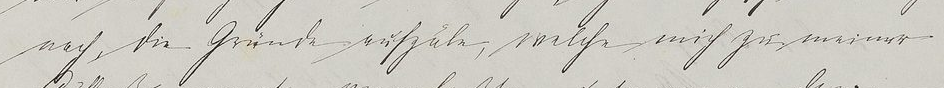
nach, die Gründe aufzäle, welche mich zu meiner
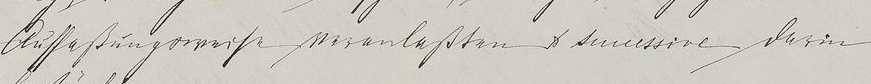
Auffaßungsweise veranlaßten & successive darin
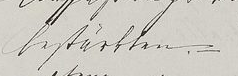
bestärkten. –
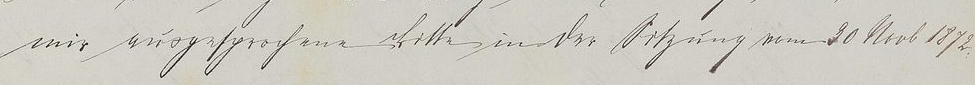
mir ausgesprochene Bitte in der Sitzung vom 30 Novb 1872
